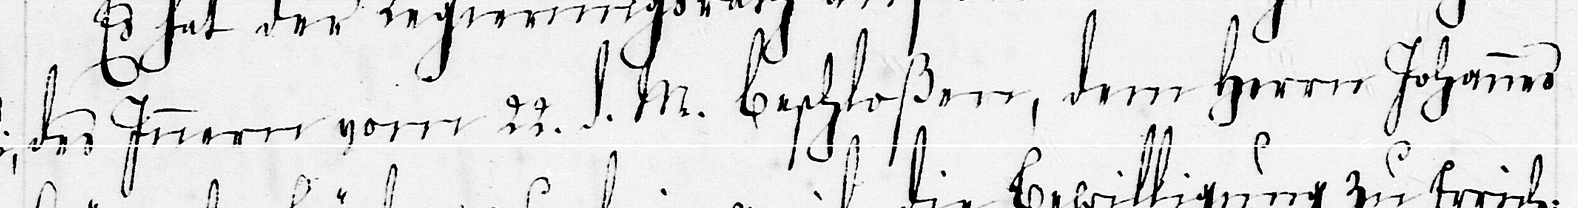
des Innern vom 22. d. M. beschloßen, dem Herrn Johannes
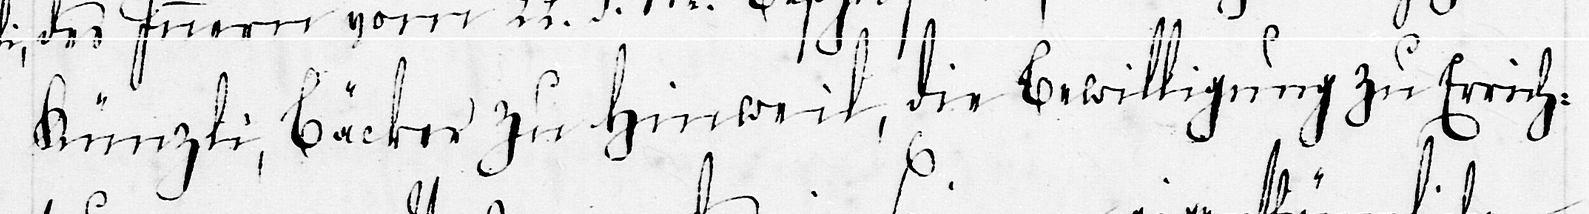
Künzli, Bäcker zu Hinweil, die Bewilligung zu Errich¬
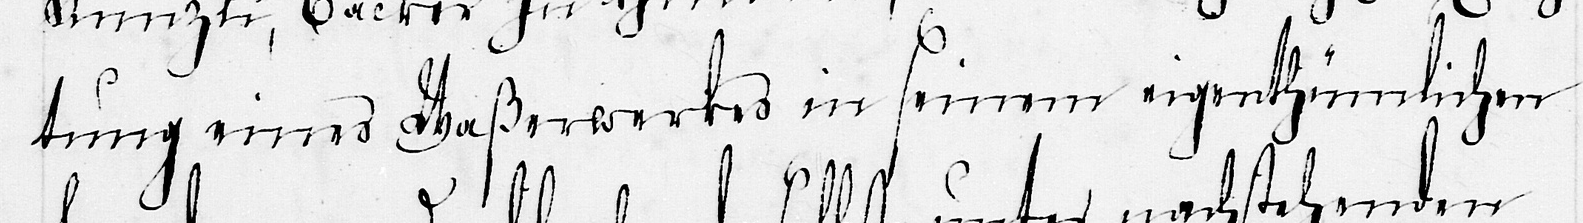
tung eines Waßerwerkes in seinem eigenthümlichen
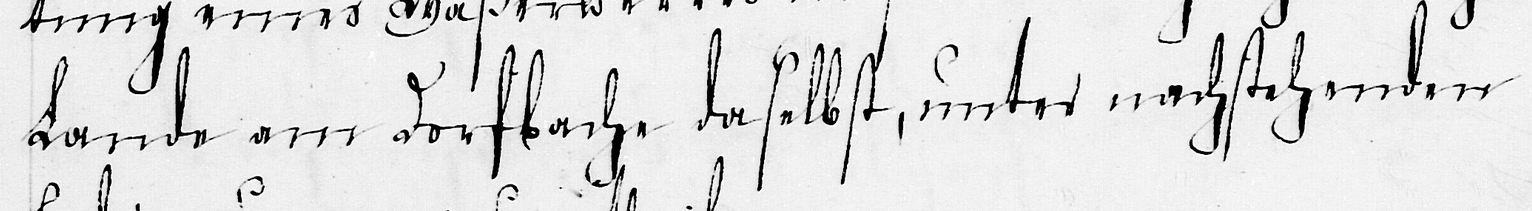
Lande am Dorfbache daselbst, unter nachstehenden
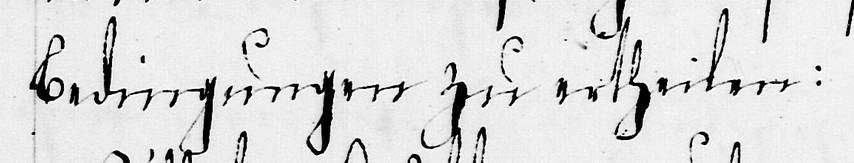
Bedingungen zu ertheilen:
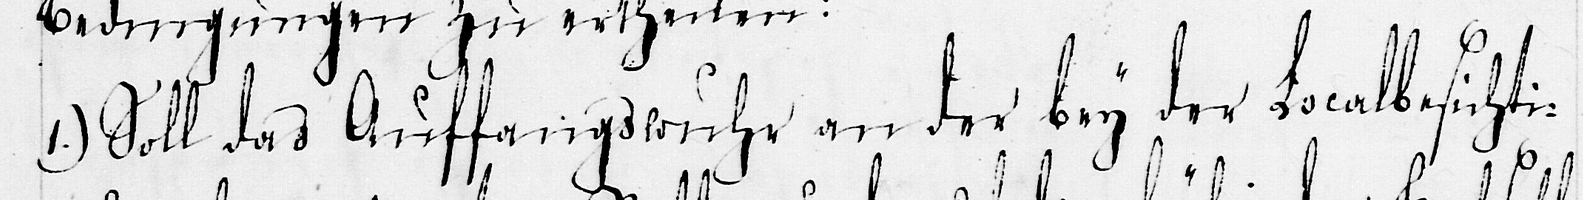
1.) Soll das Auffangswuhr an der bey der Localbesicht¬
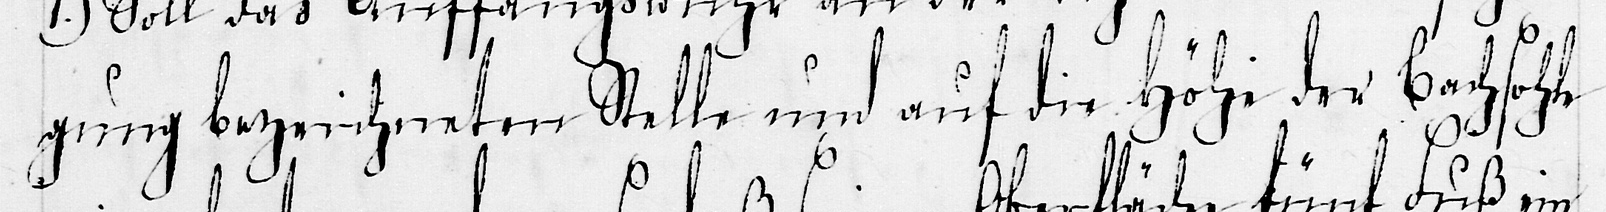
igung bezeichneten Stelle und auf die Höhe der Bachsohle
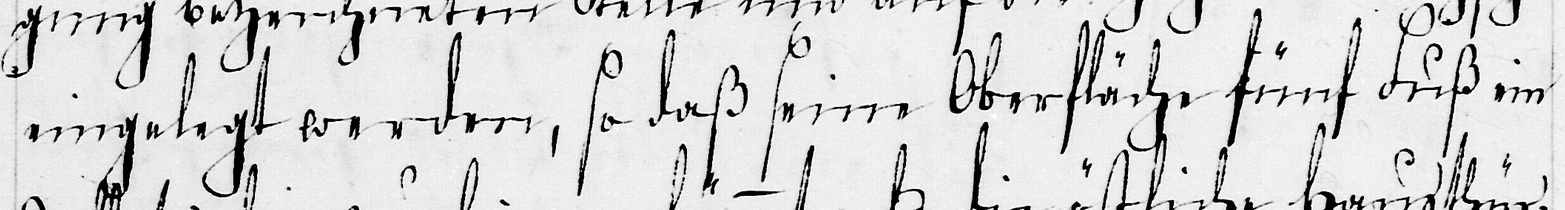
eingelegt werden, so daß seine Oberfläche fünf Fuß ein
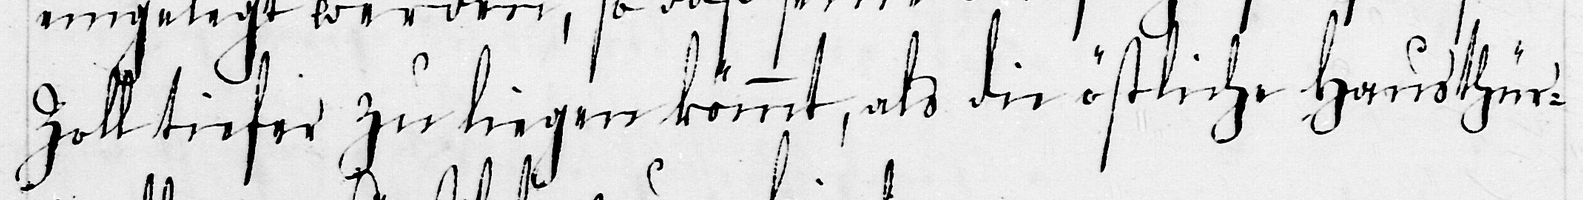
Zoll tiefer zu liegen kömmt, als die östliche Hausthür¬
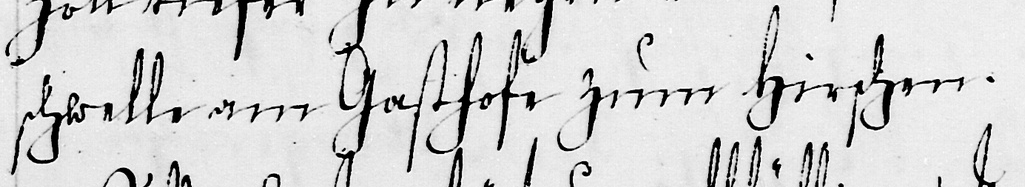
schwelle am Gasthofe zum Hirschen.
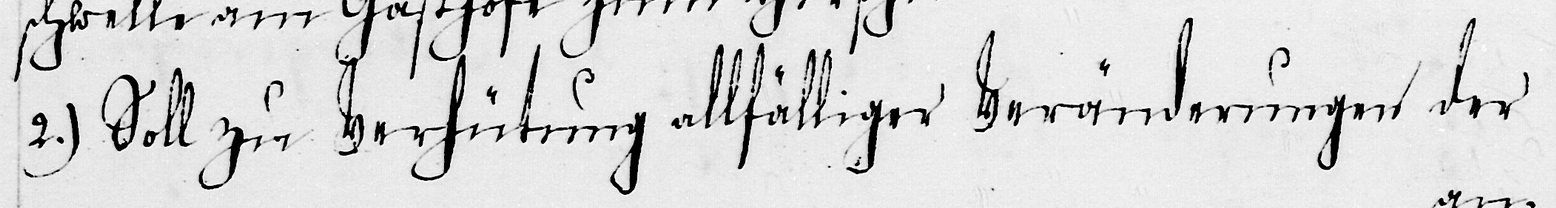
2.) Soll zu Verhütung allfälliger Veränderungen der
